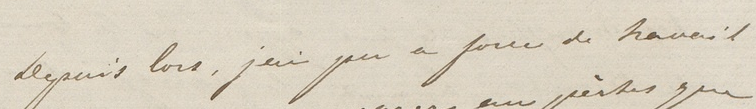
Depuis lors, j'ai pu a force de travail
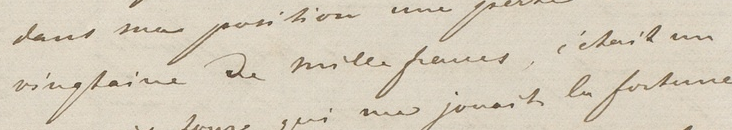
vingtaine de mille francs, c'était un
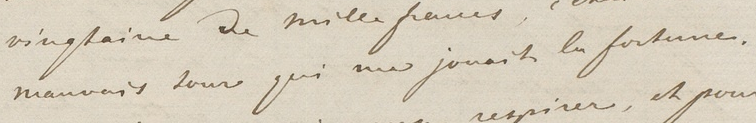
mauvais tour qui me jouait la fortune.
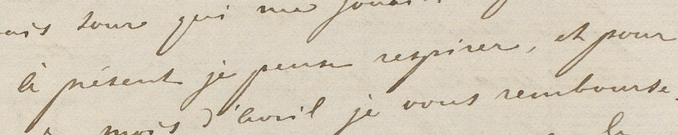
À présent je pense respirer, et pour
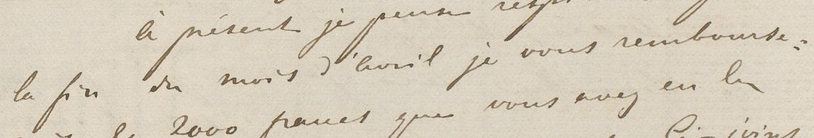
la fin du mois d'Avril je vous rem bourse-
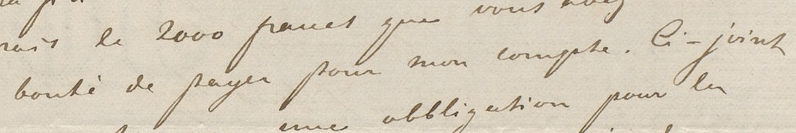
bonté de payer pour mon compte. Ci–joint
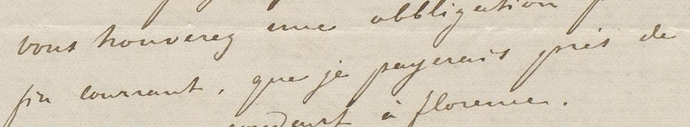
fin courrant, que je payerais près de
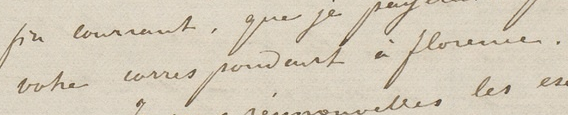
votre correspondant à Florence.
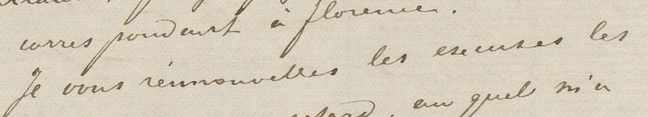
Je vous rénnouvelles les excuses les
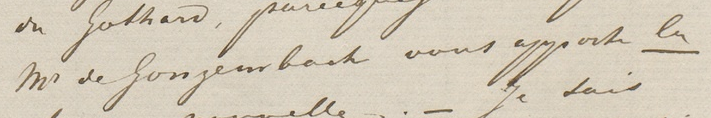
Mrde Gonzenbach vous apporte la
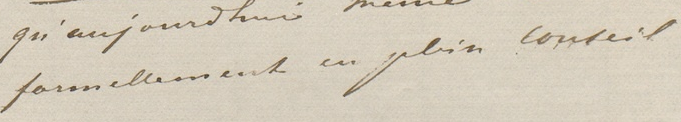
formellement en plein Conseil
